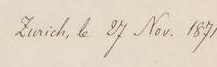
Zurich, le 27 Nov. 1871
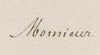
Monsieur
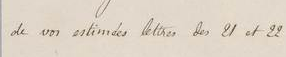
de vos estimées lettres des 21 et 22
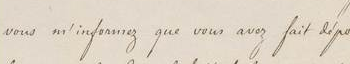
vous m'informez que vous avez fait déposer
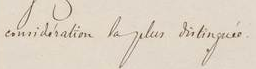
considération la plus distinguée.
